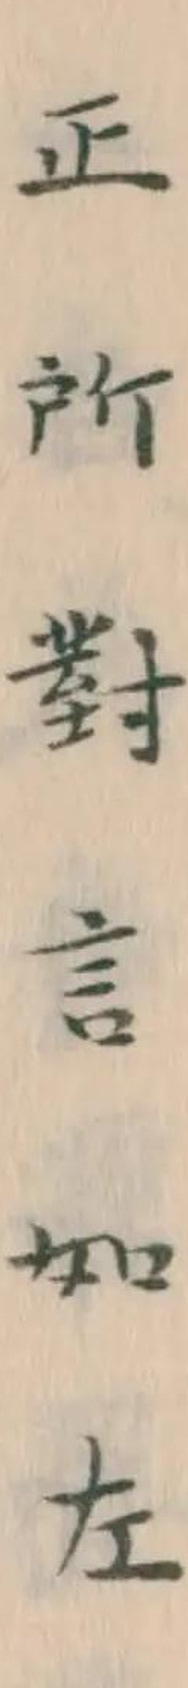正所対言如左
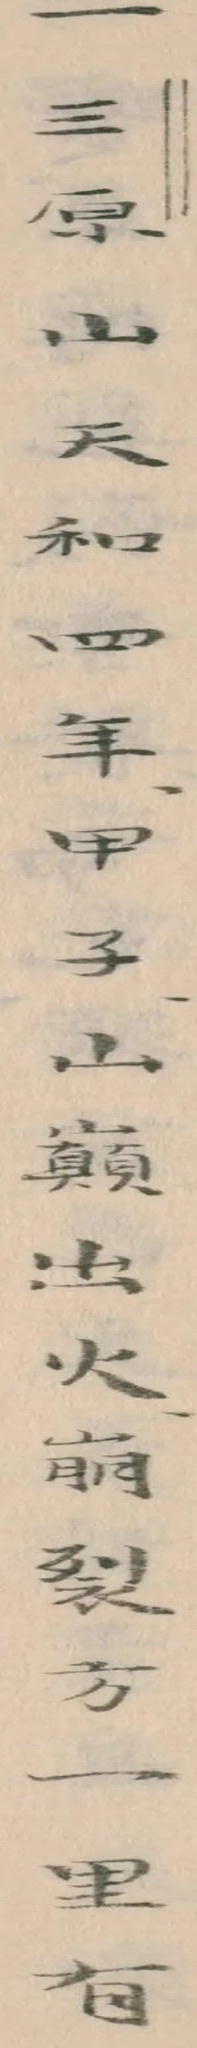一三原山天和四年、甲子、山巓出火、崩裂方一里有
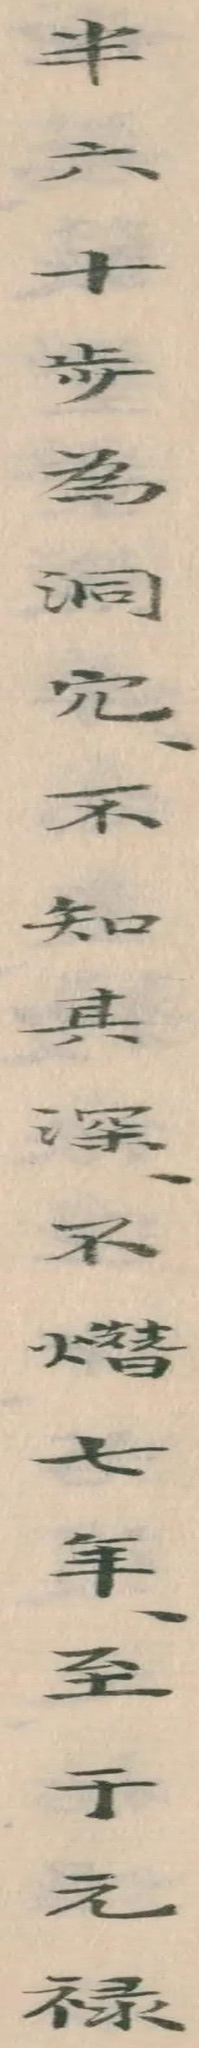半六十歩為洞穴、不知其深、不熸七年、至于元禄
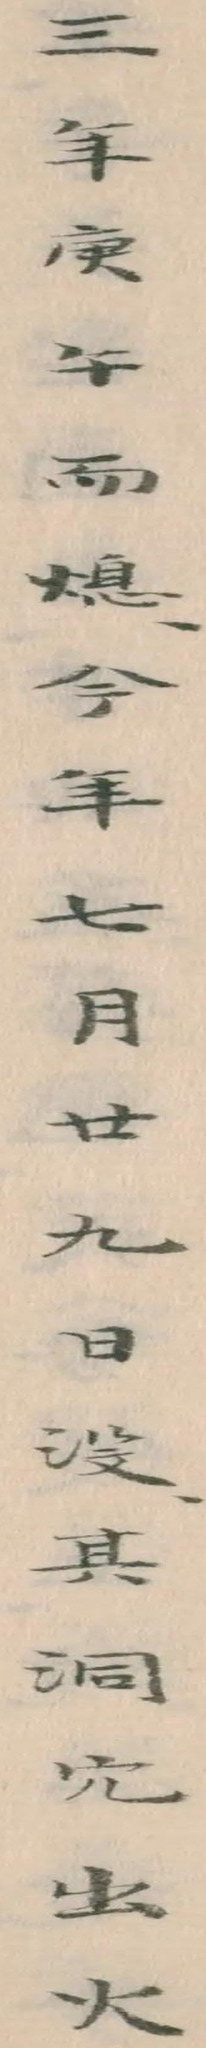三年庚午而熄、今年七月廿九日没、其洞穴出火
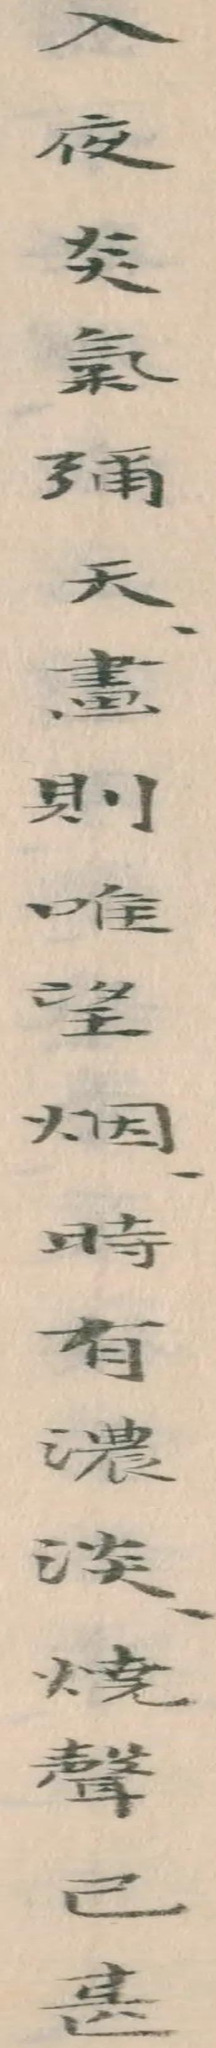入夜炎気弥天、画則唯望烟、時有濃淡、焼声已甚
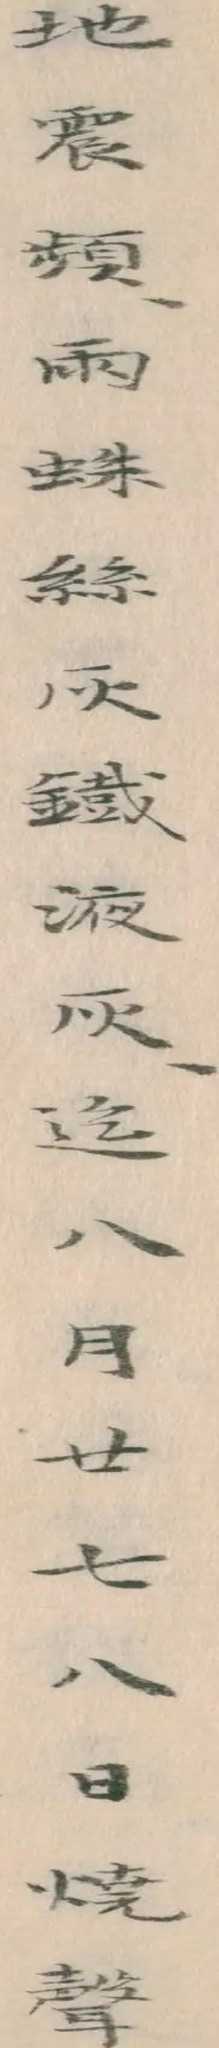地震頻、雨蛛絲灰鉄液灰、迄八月廿七八日焼声
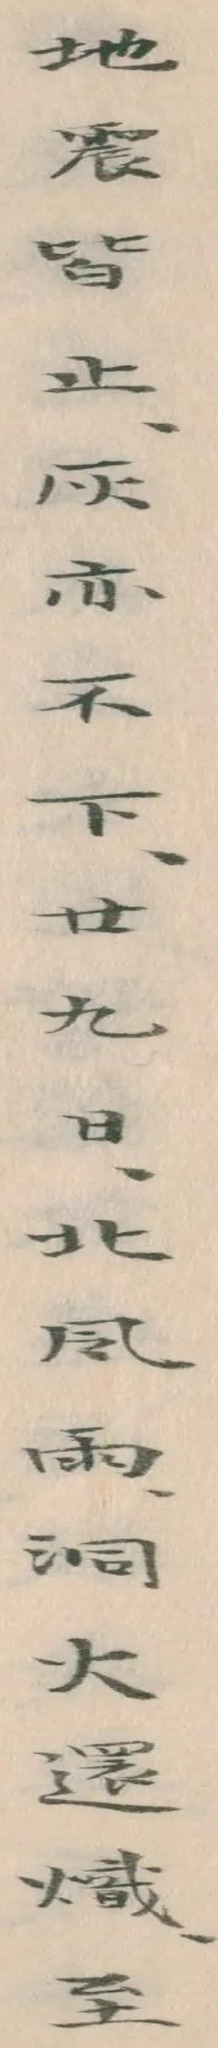地震皆止、灰亦不下、廿九日、北風雨、洞火還熾、至
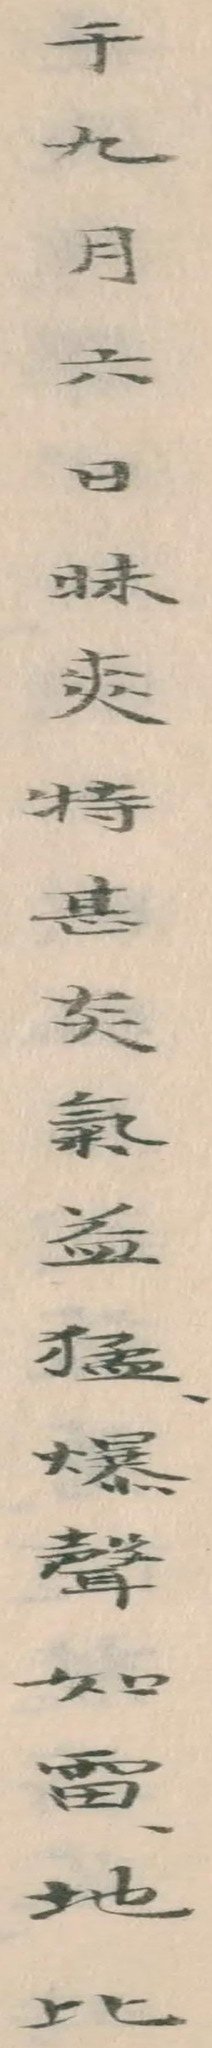于九月六日昧爽特甚炎気益猛、爆声如雷、地比
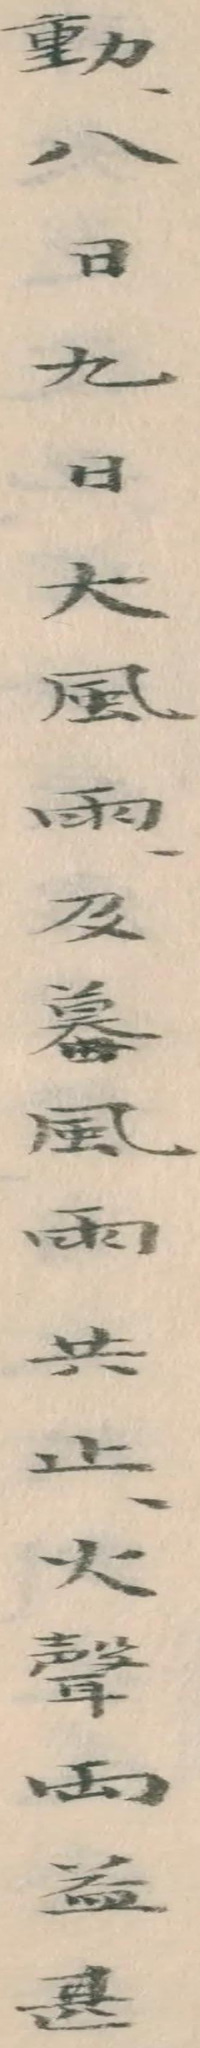動、八日九日大風雨、及暮風雨共止、火声両益甚、
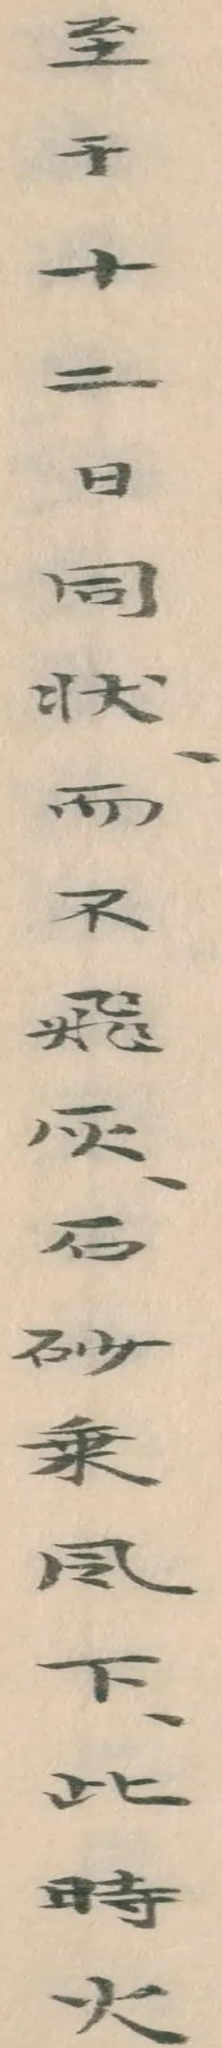至于十二日同状、而不飛灰、石砂乗風下、此時火

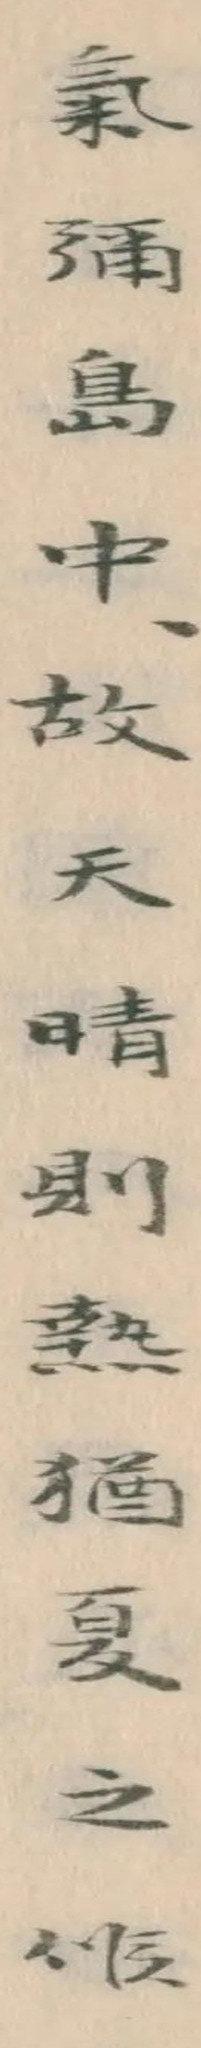気弥島中、故天晴則熱猶夏之候
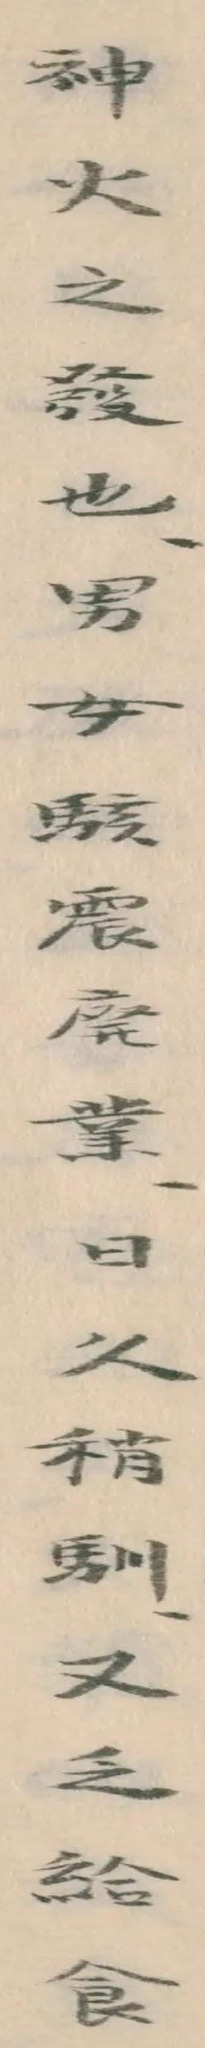一神火之発也、男女駭震廃業、日久稍馴、又乏給食
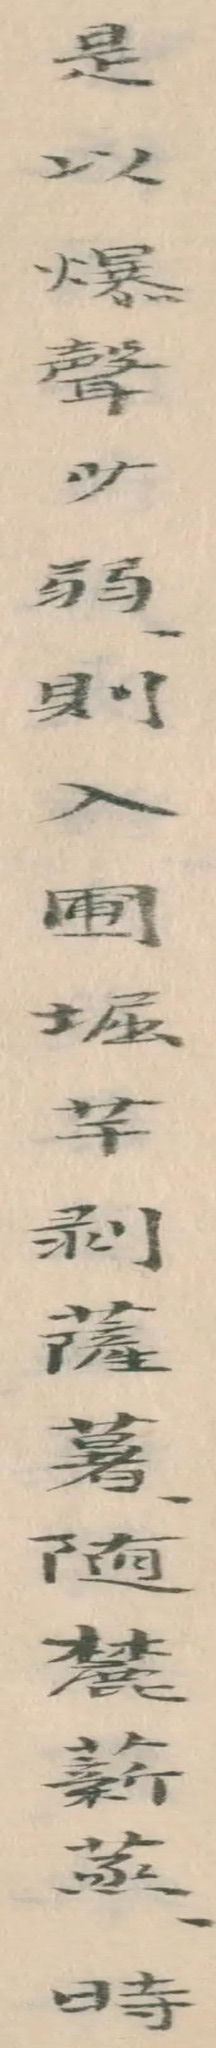是以爆声少弱、則入圃堀芋剥薩薯、随麓薪蒸、時
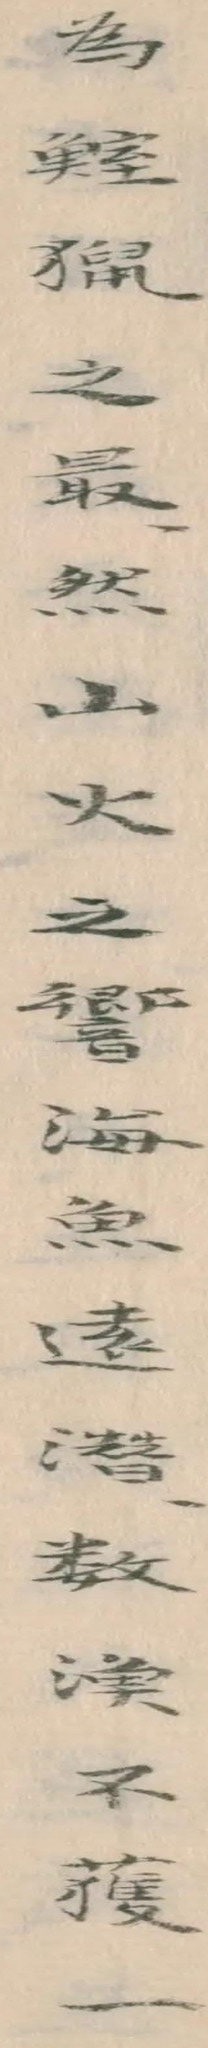為鰘猟之最、然山火之響海魚遠潜、数漁不獲一
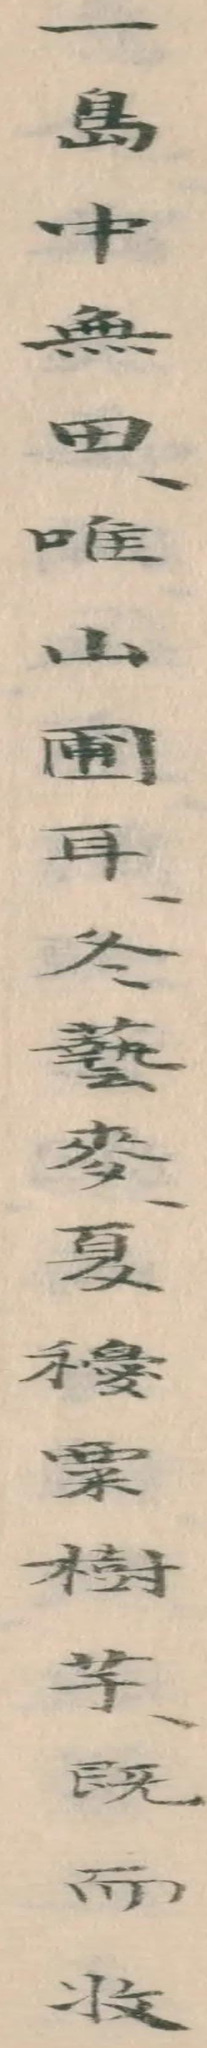一島中無田、唯山圃耳、冬芸麦、夏粟樹芋、既而収
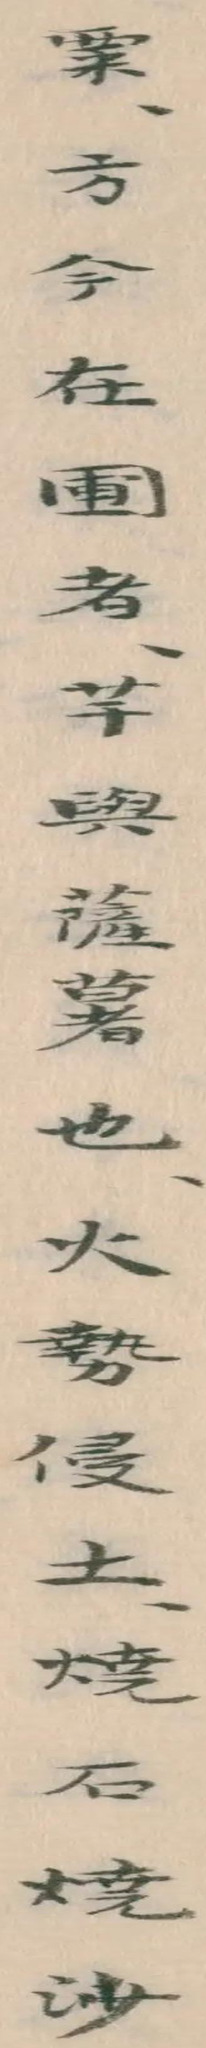粟、方今在圃者、芋与薩薯也、火勢侵土、焼石焼沙
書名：地災撮要. 巻11-12(地震之部)
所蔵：国立国会図書館 National Diet Library, JAPAN
